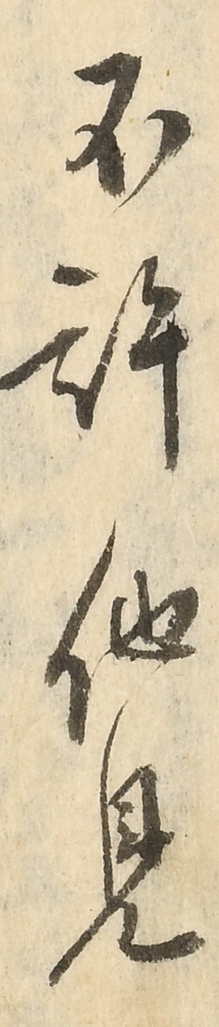不許他見

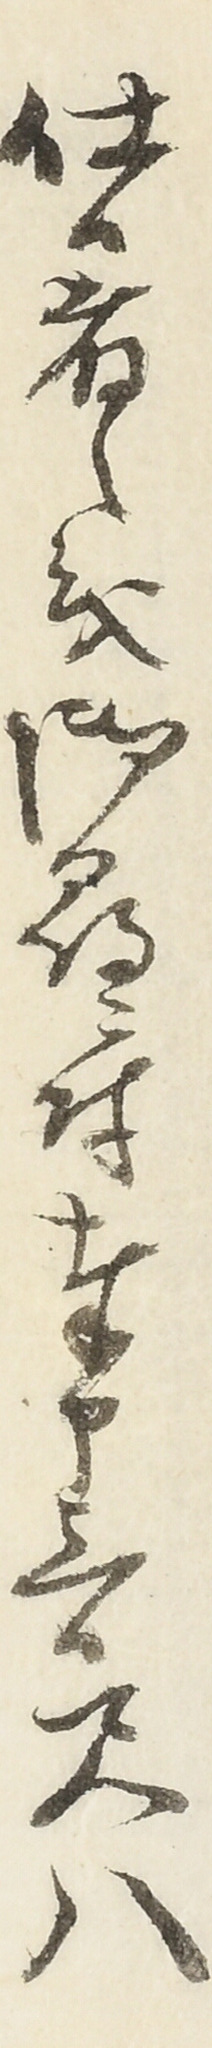仕候者之義御尋ニ付奉申上候尺八
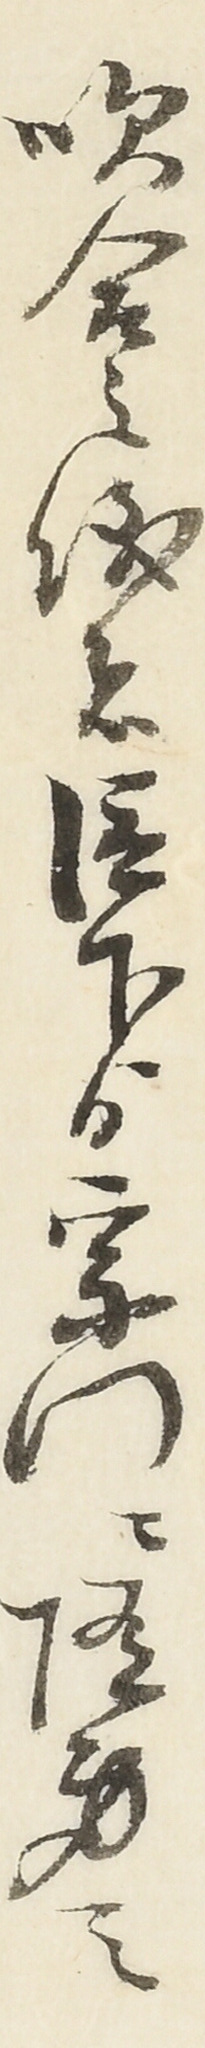吹合之儀者従下より宗門ニ随身之
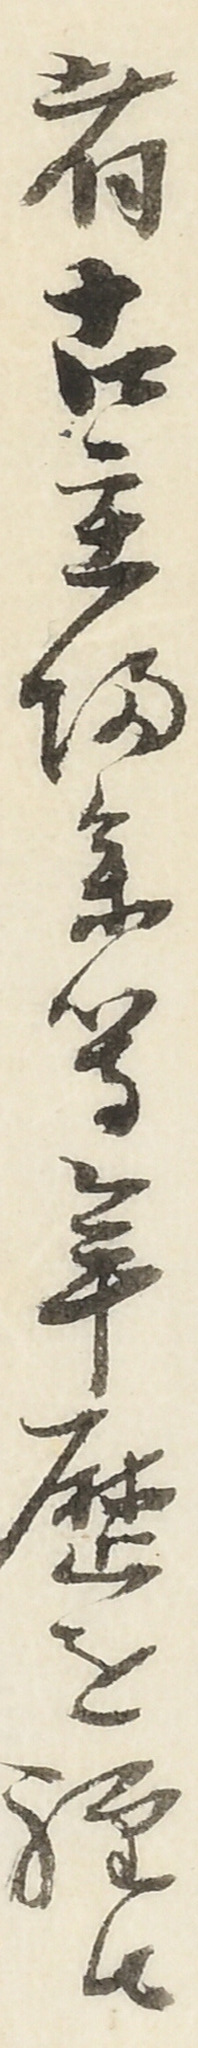者古主帰参等年歴を経候
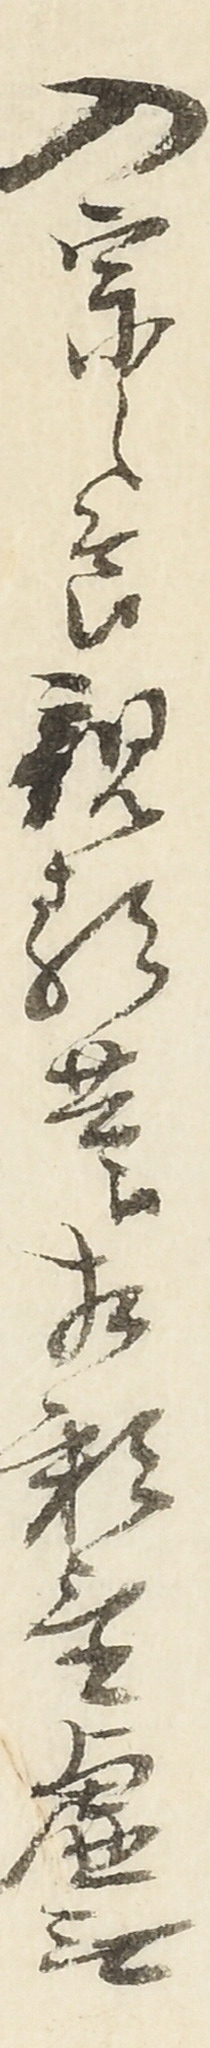入宗之節親類共江相頼置虚無
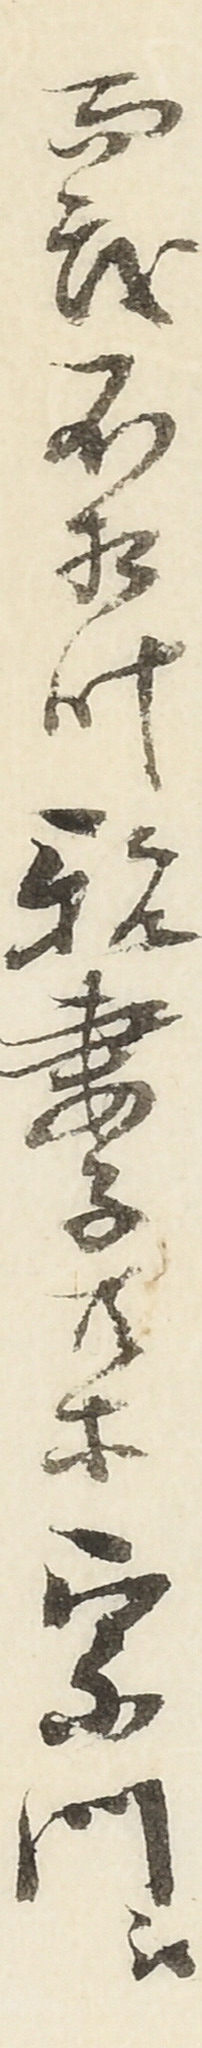而も不相叶親妻子共等宗門江
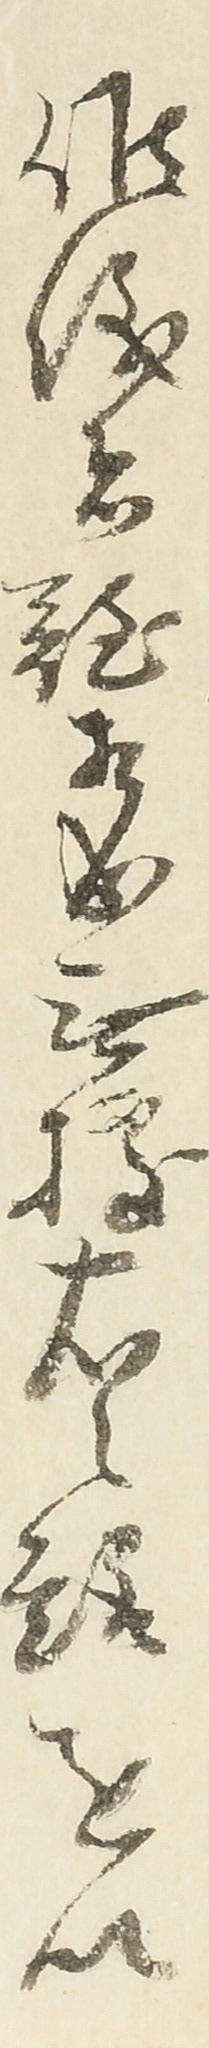作儀者難相成無拠右之趣を以
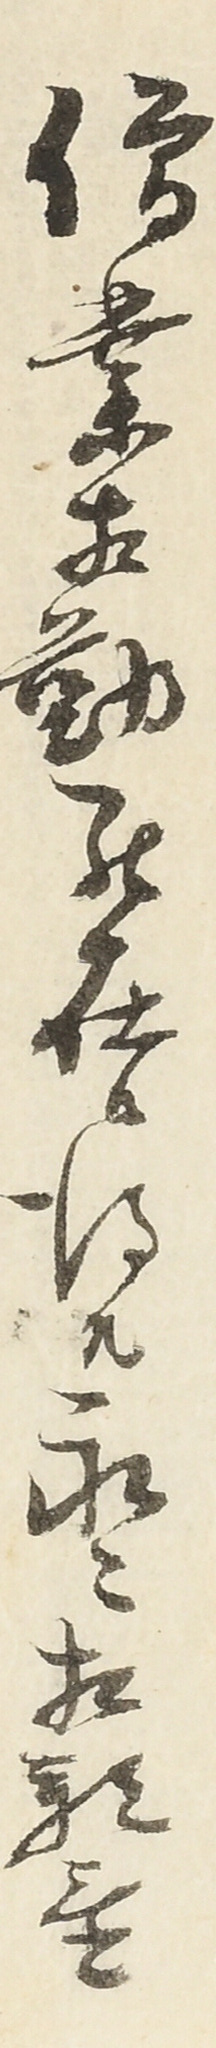僧業相勤罷在候得共永々相頼置
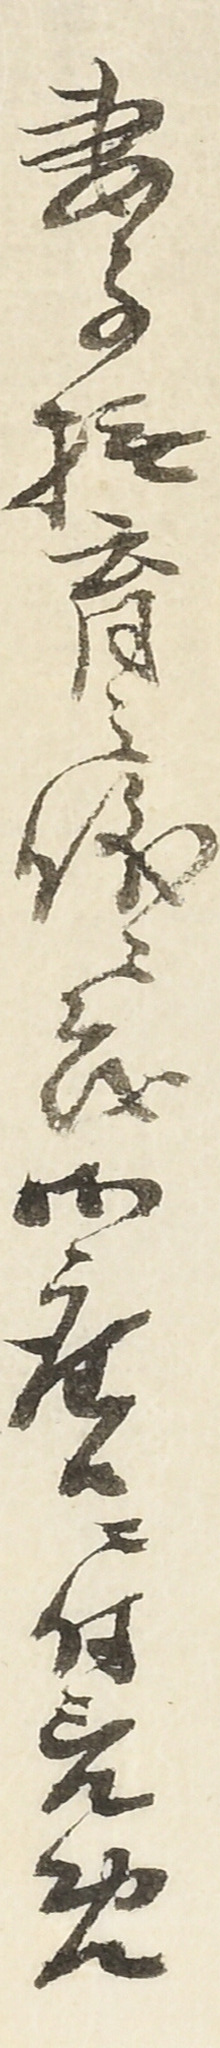妻子撫育之儀ニも御座候ニ付差免
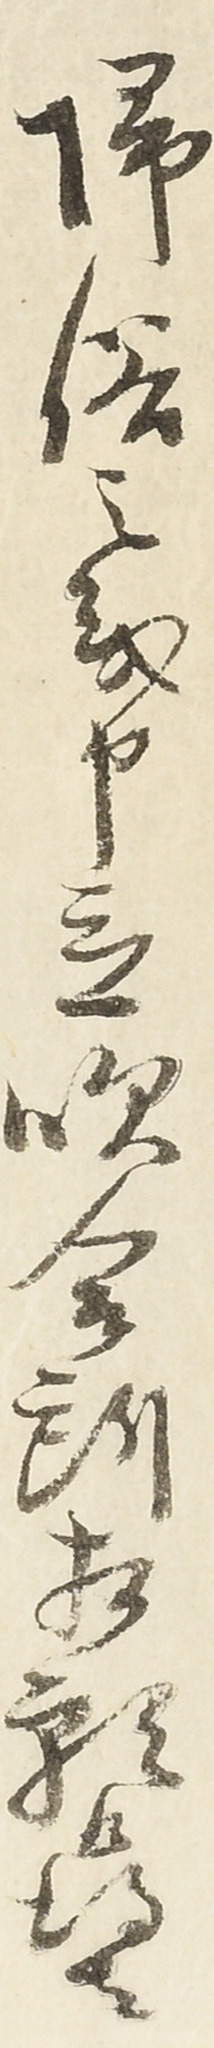帰俗之義申立吹合所相願候得は
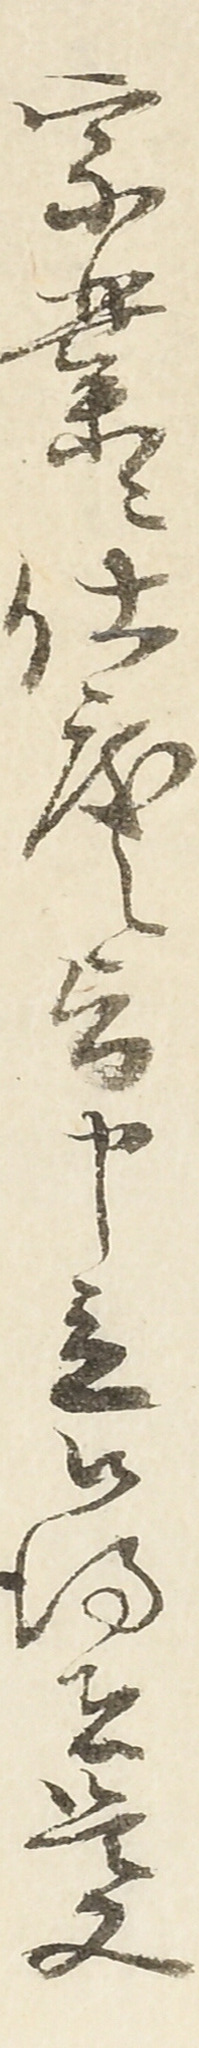家業ニ仕度之旨申立候得者是又
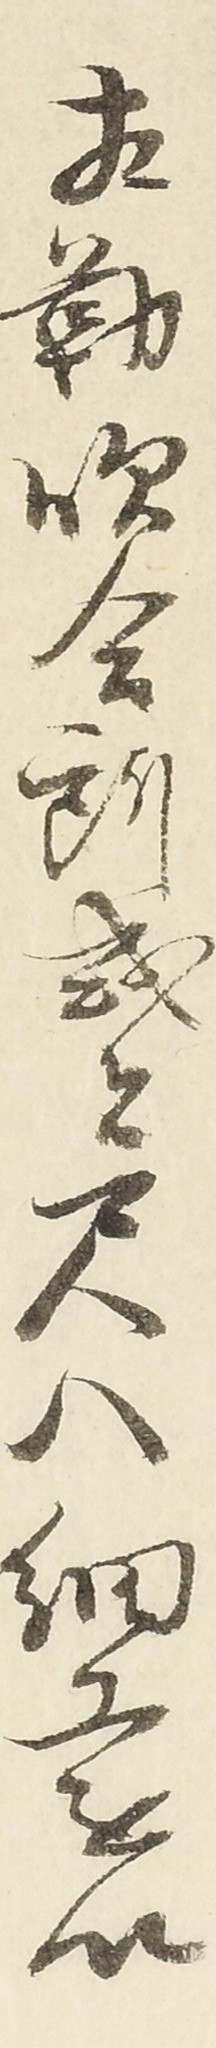相勤吹合所或は尺八細工を以
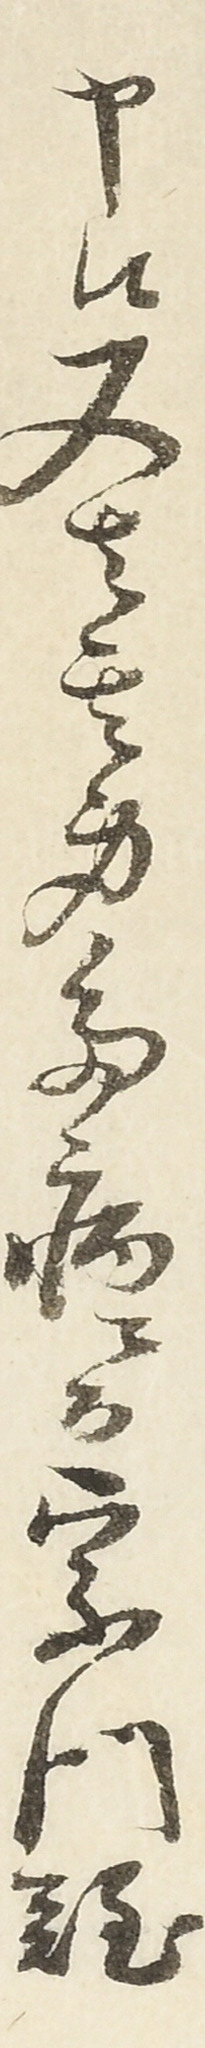申候又は其身多病ニ而宗門難
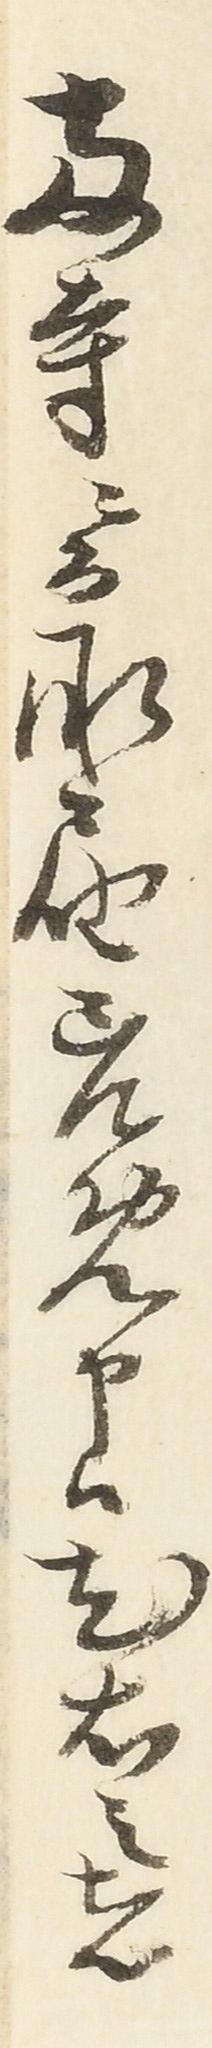両寺ニ而承届差免申候尤右之者
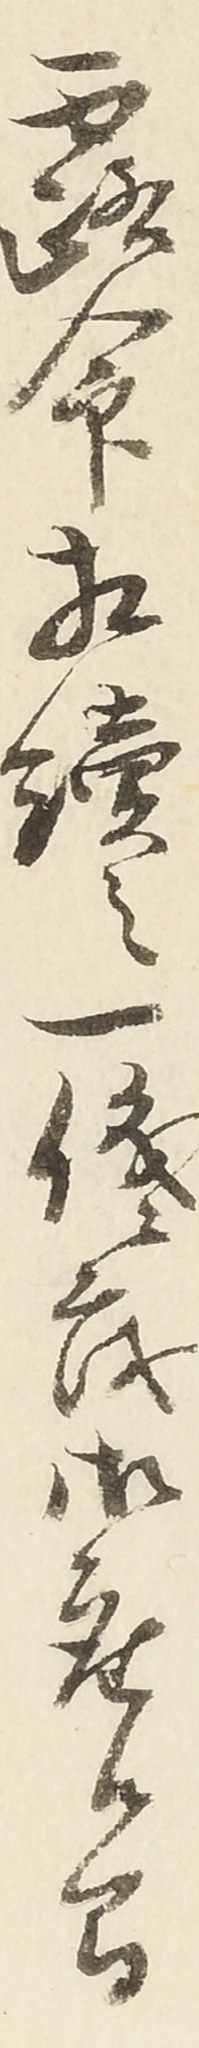露命相続之一儀ニも御座候間
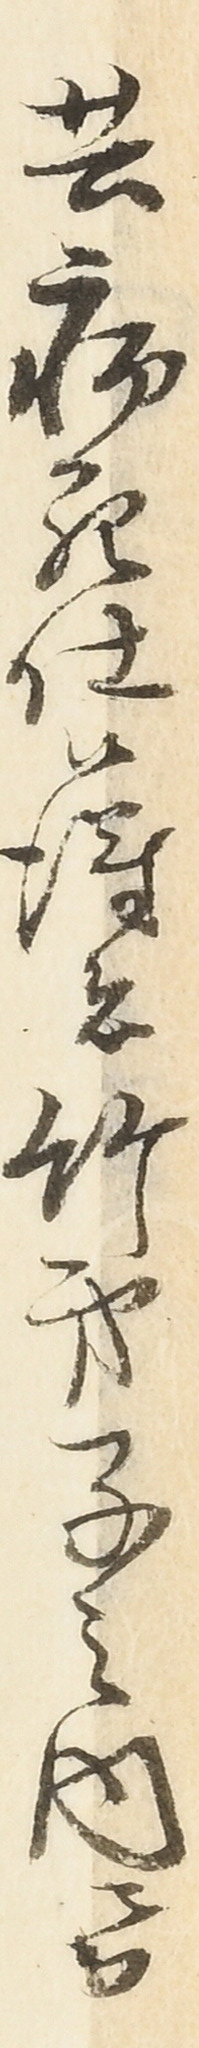共病死仕候得は竹弟子之内ニ而
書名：秘書
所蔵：伊那市立高遠町図書館・合同会社AMANE
